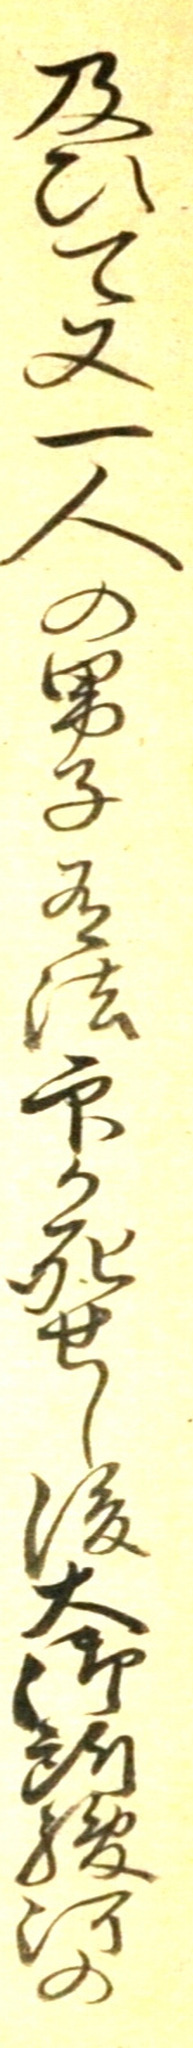及ひて又一人の男子有法印死せし後大御所駿河の
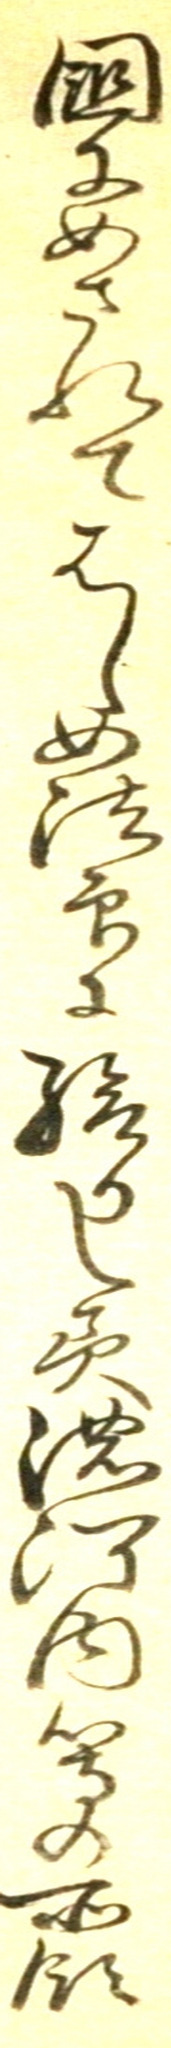国にめされてはしめ法印に給りし美濃河内等の所領
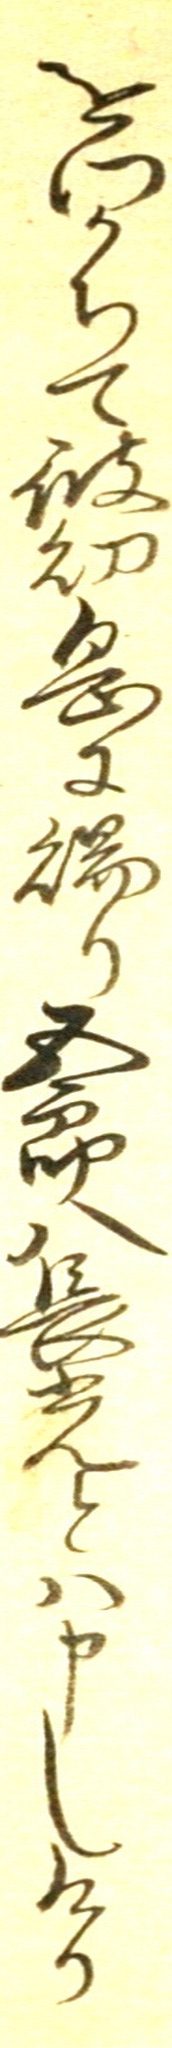をわかちて彼幼息に賜り五郎八長光とは申しけり

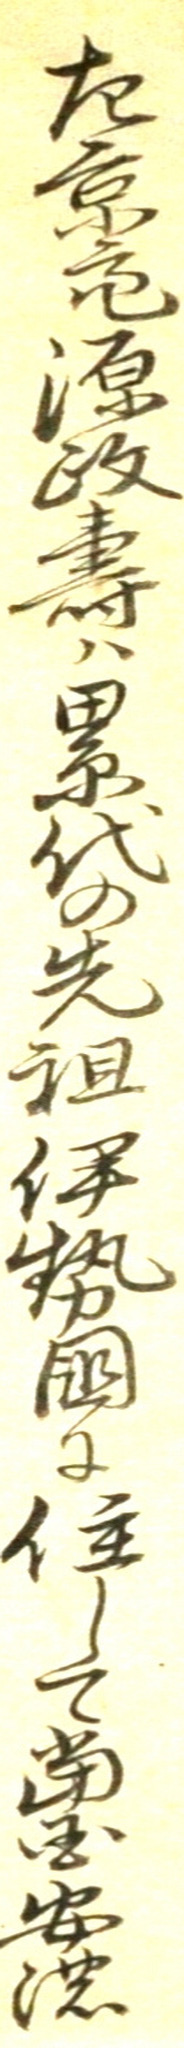左京亮源政寿は累代の先祖伊勢国に住して当国安濃
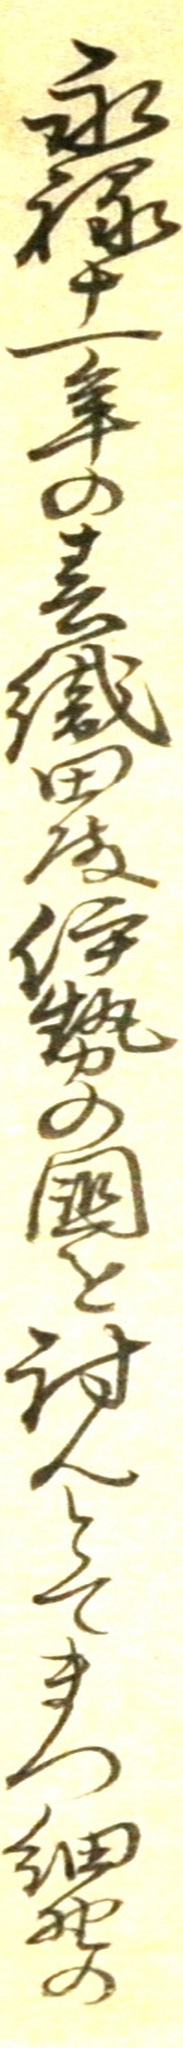永禄十一年の春織田殿伊勢の国を討んとてまつ細野の
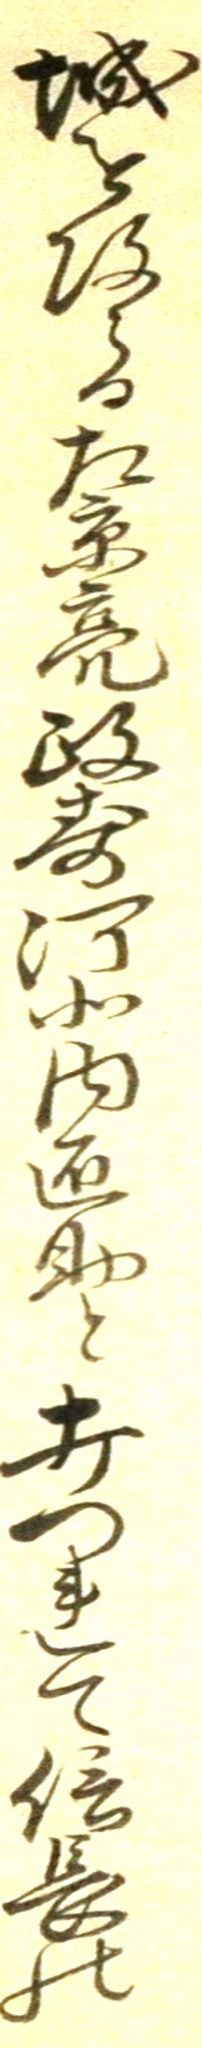城を攻らる左京亮政寿河北内匠助と打つれて信長の
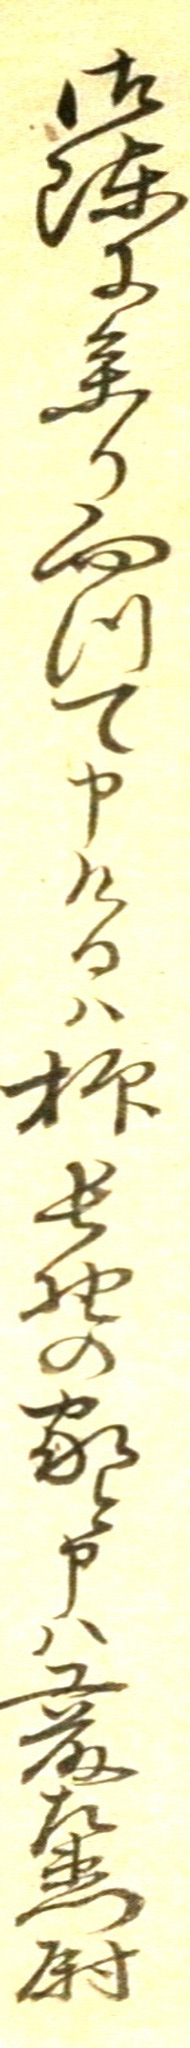御陣に参り向つて申けるは抑長野の家と申は工藤左衛門尉
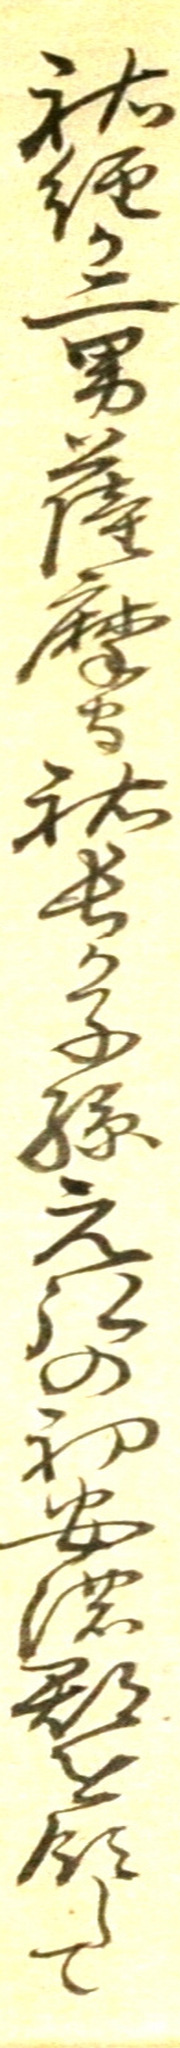祐経か二男薩摩守祐長か子孫元弘の初安濃郡を領して
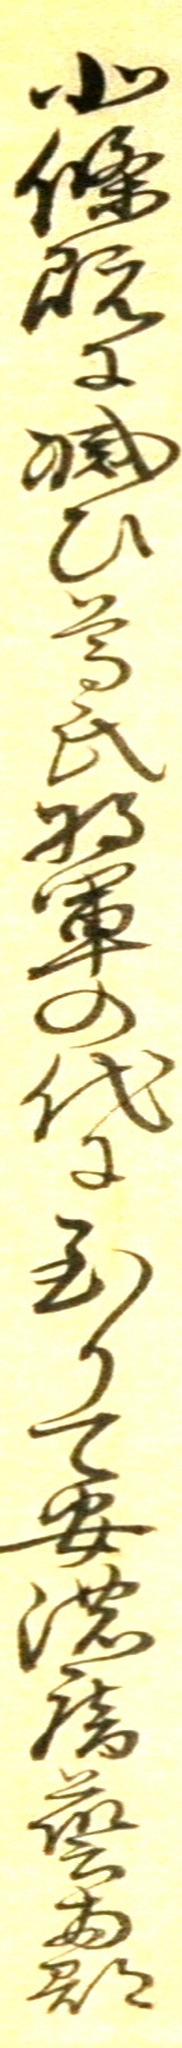北条既に滅ひ尊氏将軍の代に至りて安濃庵芸両郡

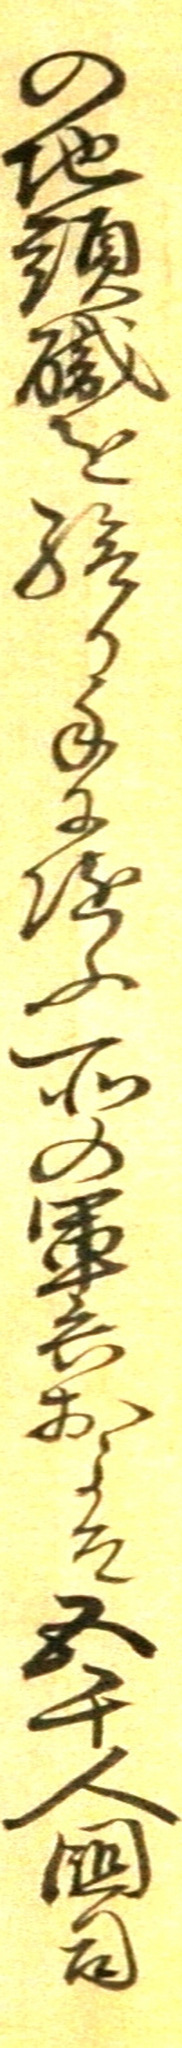の地頭職を給り手に随ふ所の軍兵およそ五千人国司
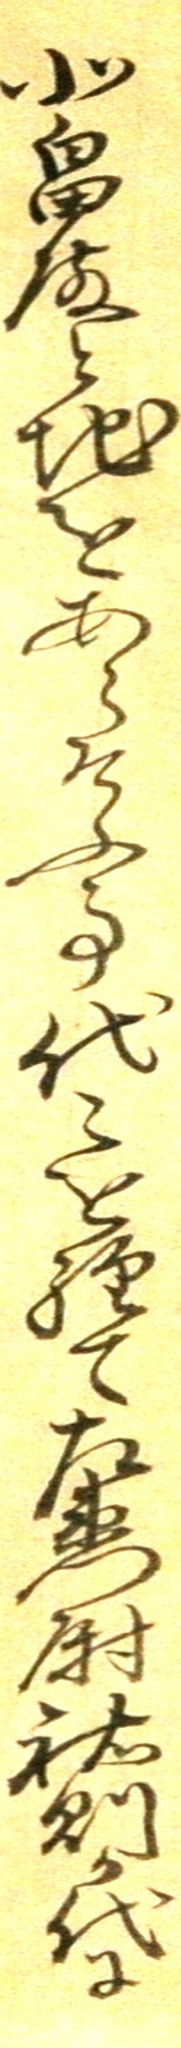北畠殿と地をあらそふ事代々を経て左衛門尉祐則か代に
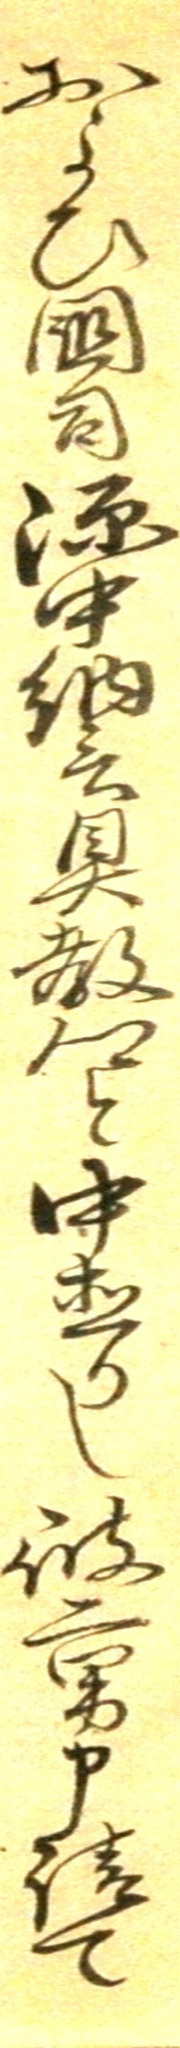およひ国司源中納言具教卿と中直りし彼二男申請て
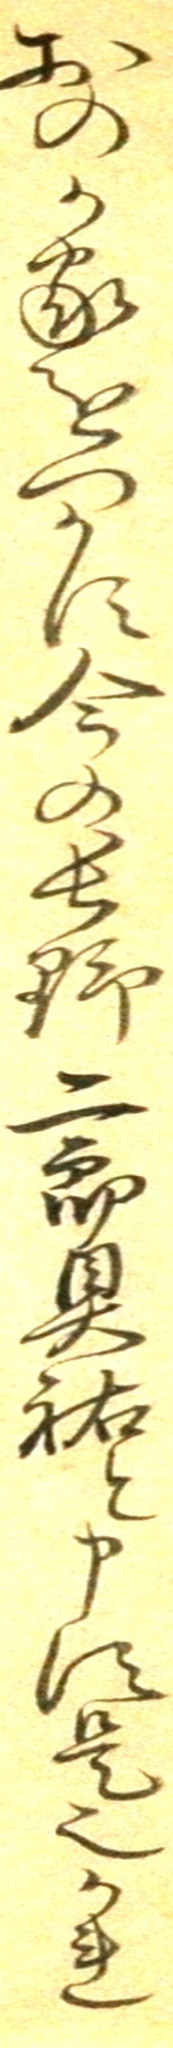おのか家をつかす今の長野二郎具祐と申す是也かれ
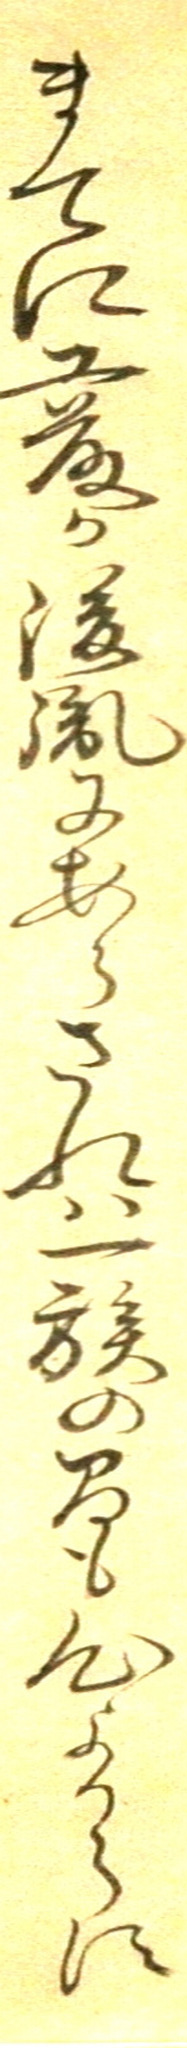まてに工藤か後胤にあらされは一族の間も心よからす
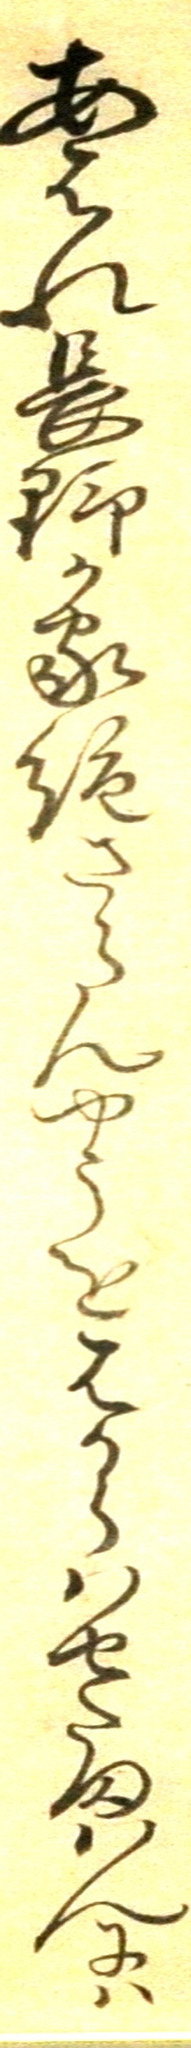あはれ長野か家絶さらんやうをはからはせたまはんには
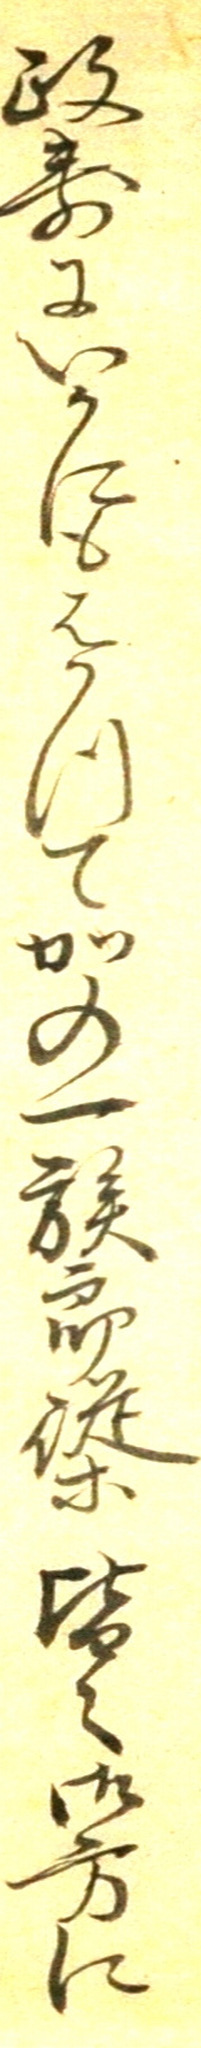政寿にいかにもはかつてかの一族郎従等皆々御方に
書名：藩翰譜（九・上）
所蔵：伊那市立高遠町図書館・合同会社AMANE
